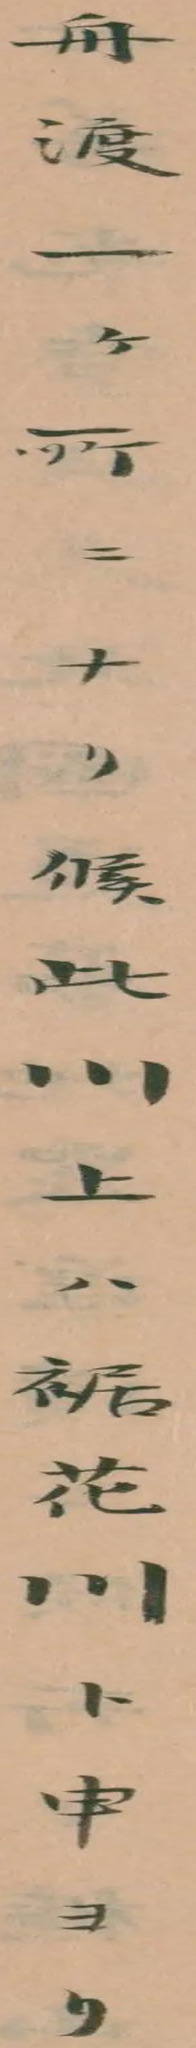舟渡一ヶ所ニナリ候此川上ハ裾花川ト申ヨリ
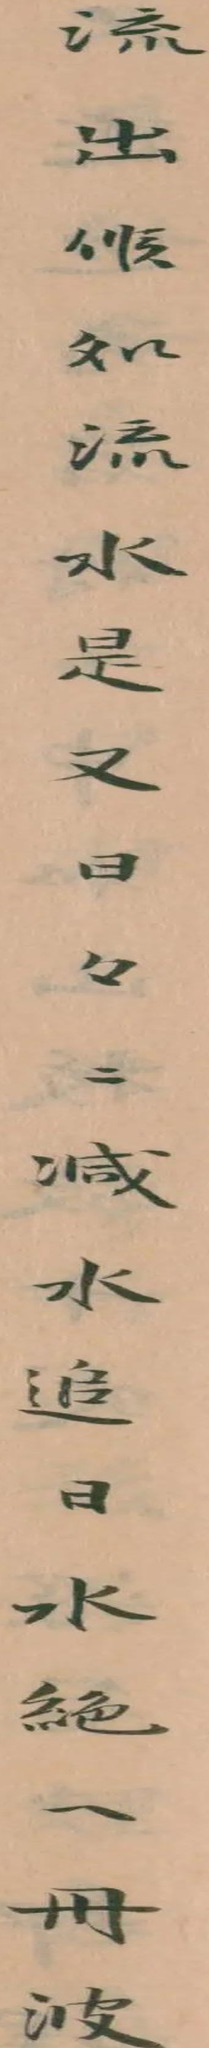流出候処流水是又日々ニ減水追々水絶ヘ丹波
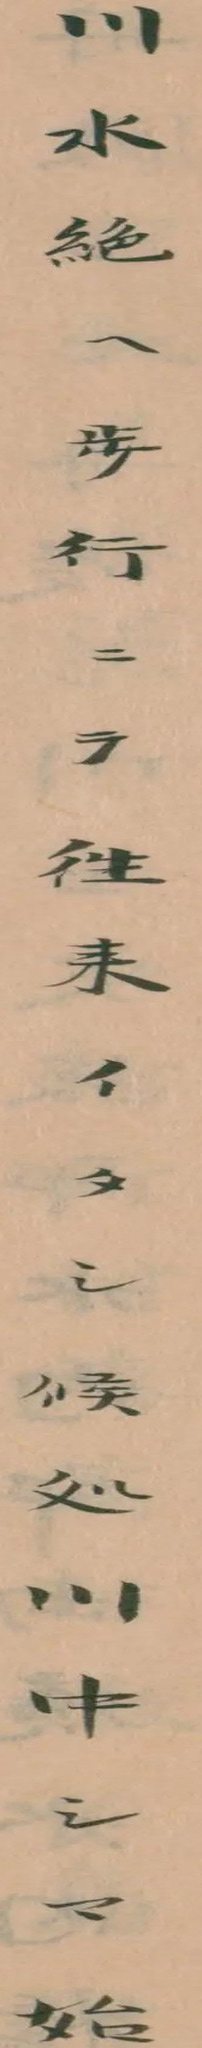川水絶ヘ歩行ニテ往来イタシ候処川中シマ始
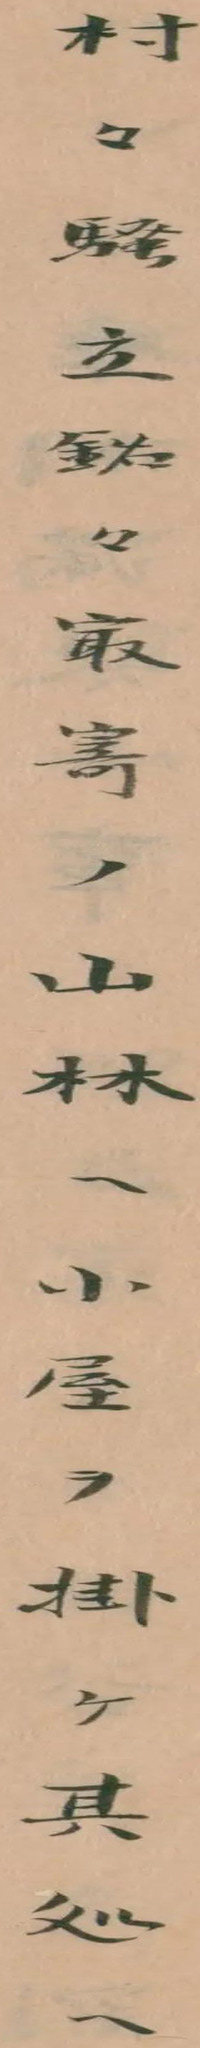村々騒立銘々最寄ノ山林ヘ小屋ヲ掛ケ其処ヘ
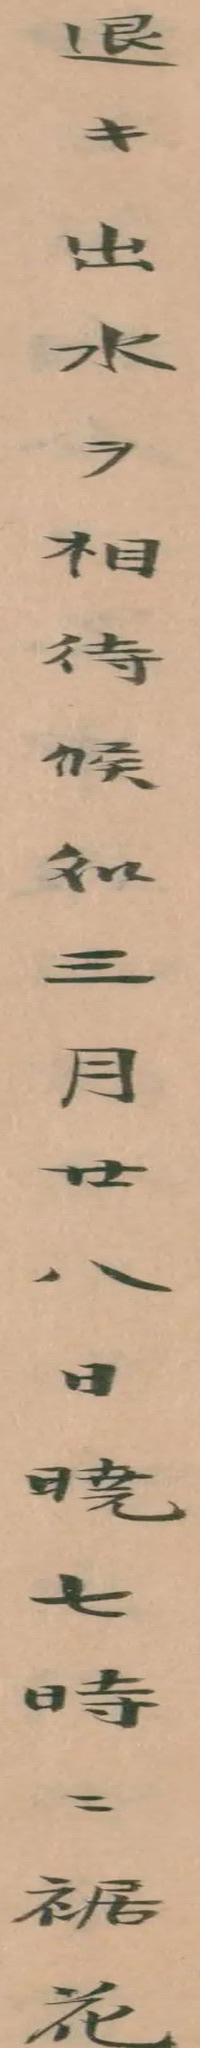退キ出水ヲ相待候処三月廿八日暁七時ニ裾花
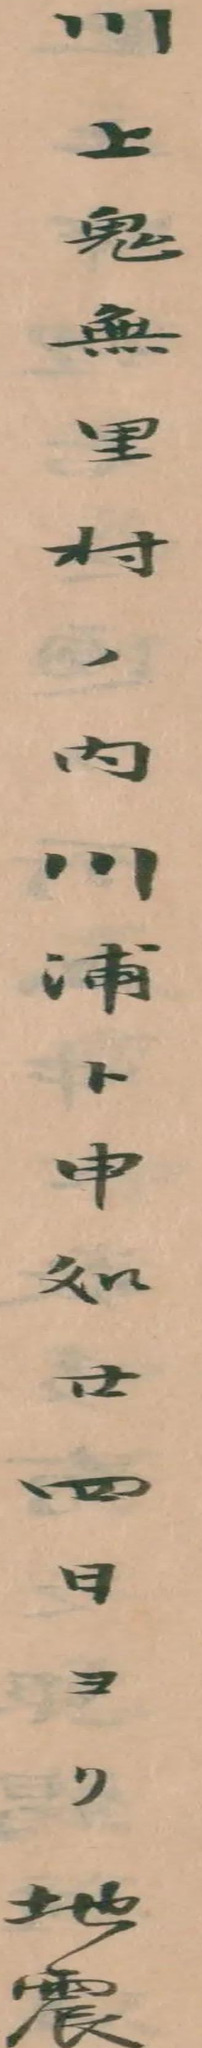川上鬼無里村ノ内川浦ト申処廿四日ヨリ地震
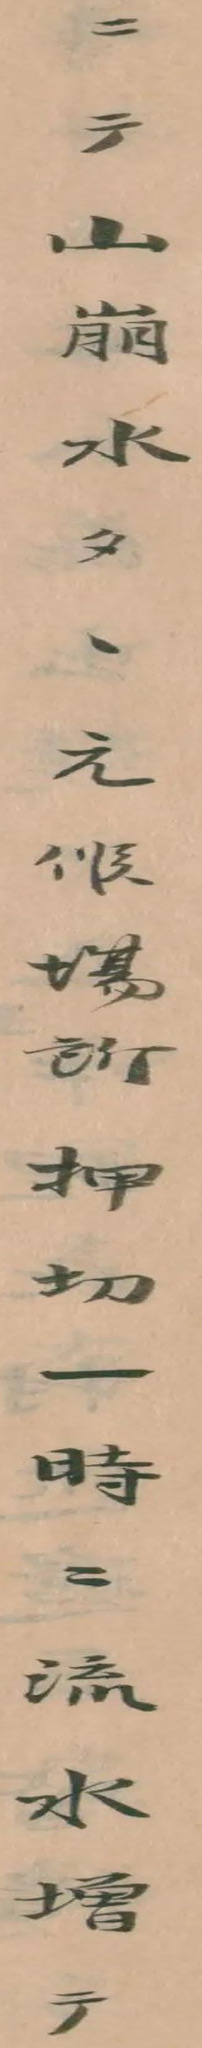ニテ山崩水タヽえ候場所押切一時ニ流水増テ
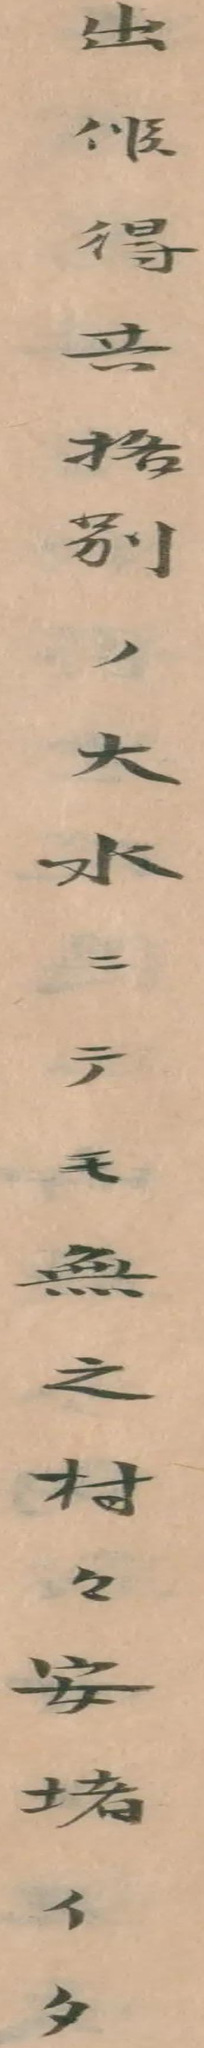出候得共格別ノ大水ニテモ無之村々安堵イタ
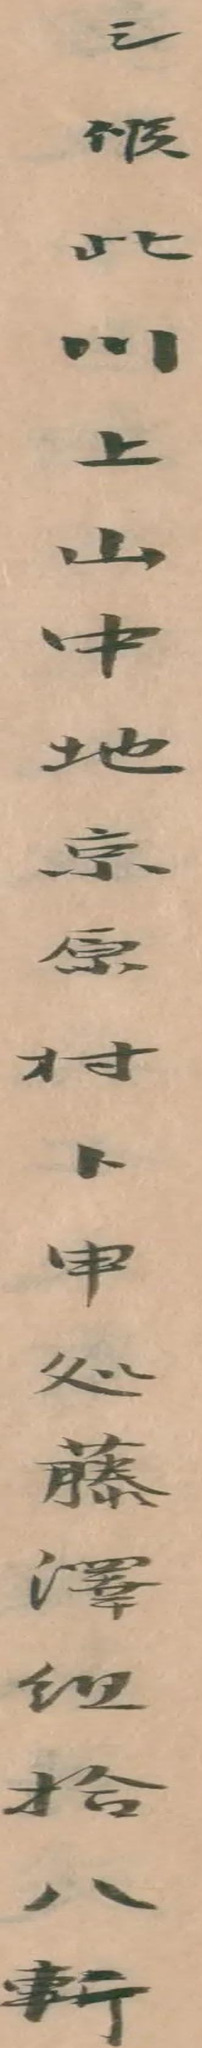シ候此川上山中地京原村ト申処藤沢組拾八軒
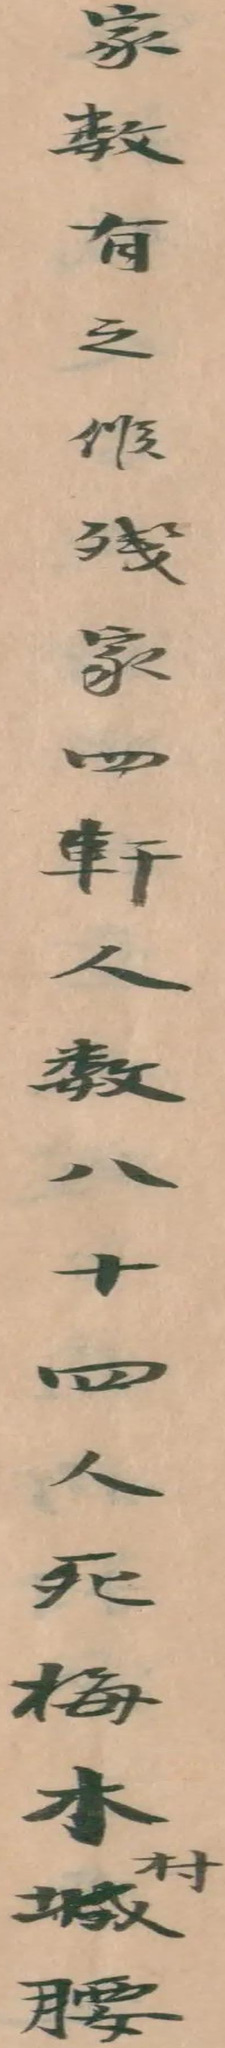家数有之候残家四軒人数八十四人死梅木村城腰
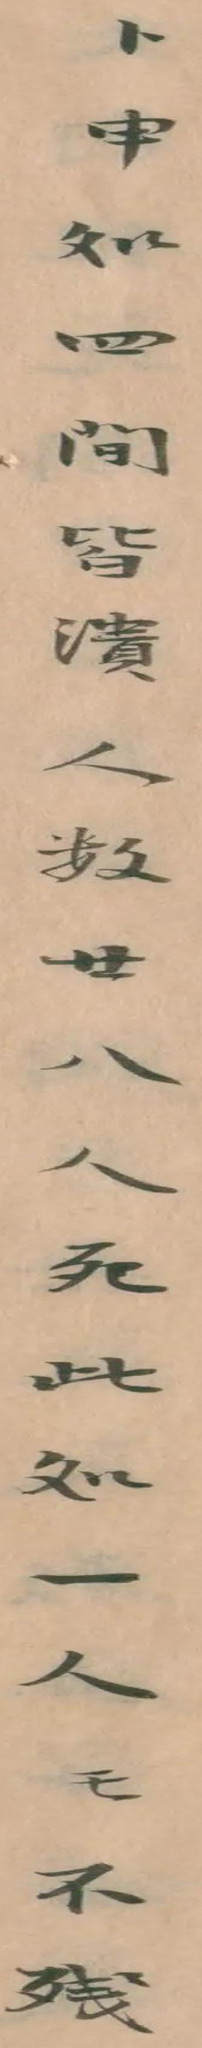ト申処四間皆潰人数廿八人死此処一人モ不残

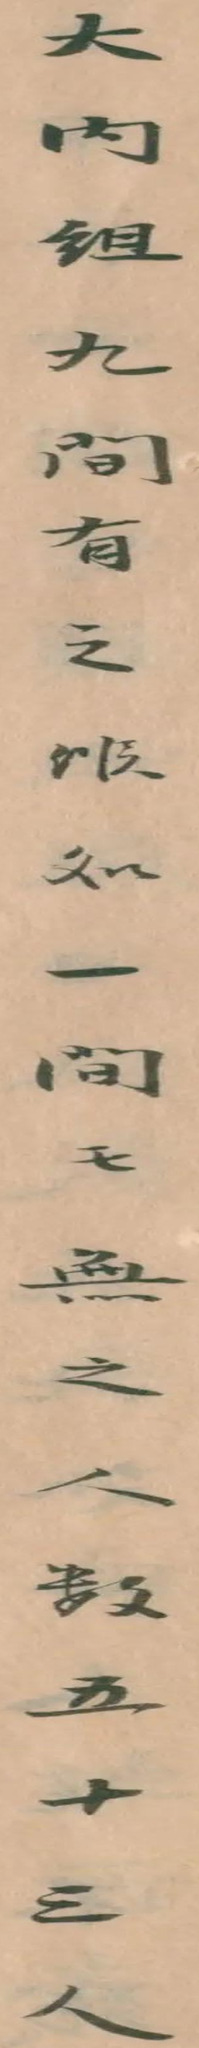大内組九間有之候処一間モ無之人数五十三人
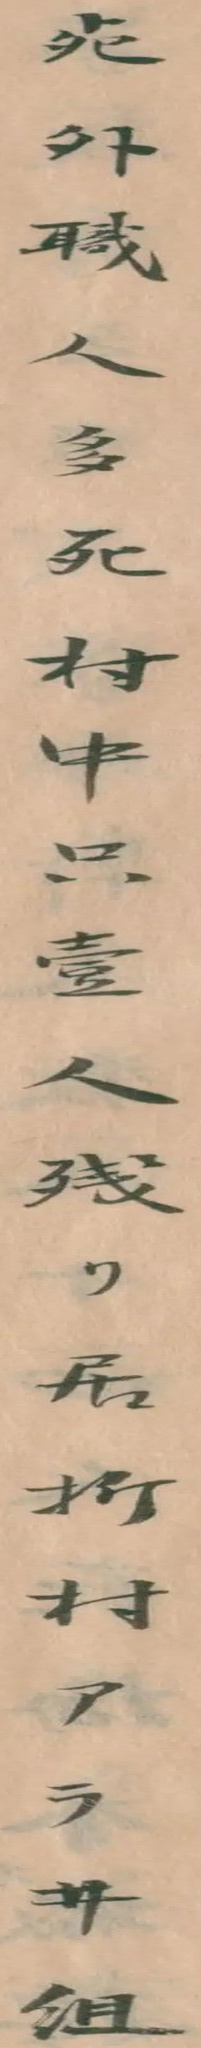死外職人多死村中只壹人残リ居折村アラ井組
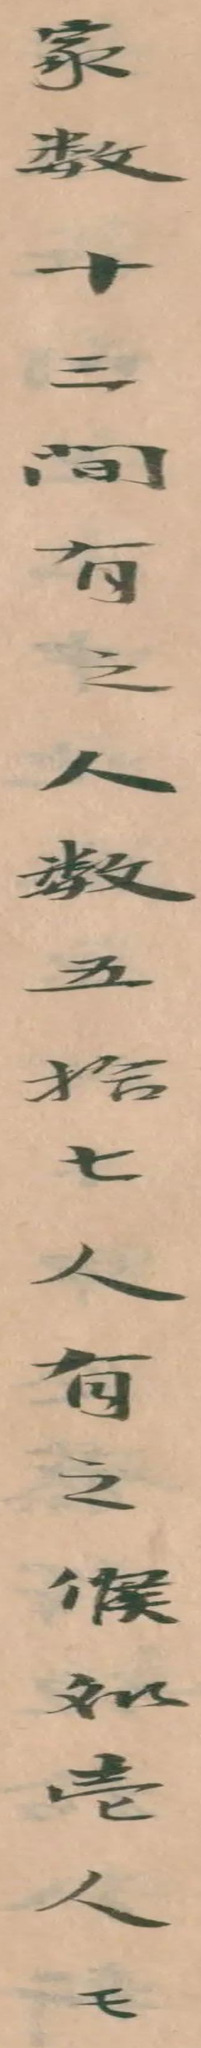家数十三間有之人数五拾七人有之候処壱人モ
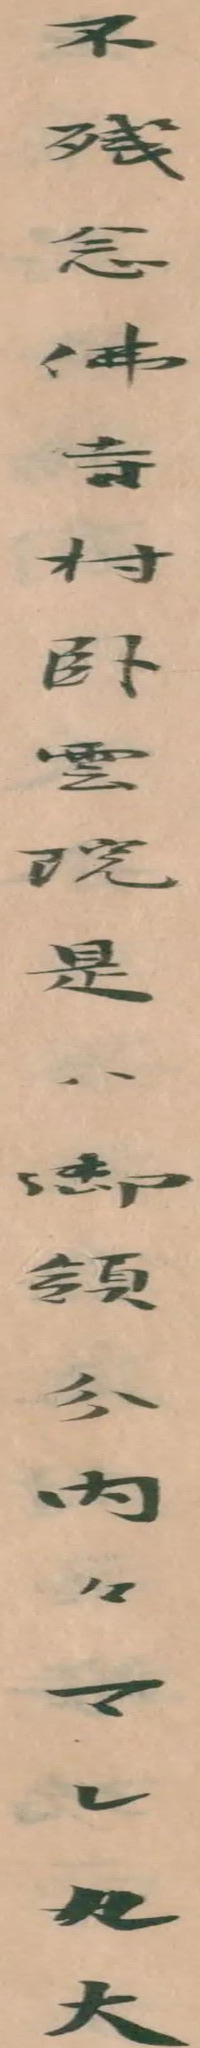不残念仏寺村臥雲院是ハ御領分内々マレ(ナ)ル大
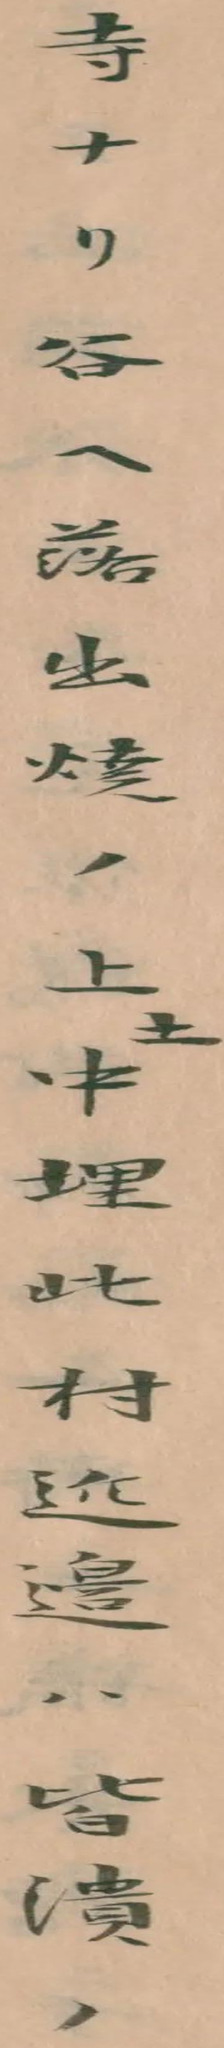寺ナリ谷ヘ落出焼ノ上土中埋此村近辺ハ皆潰ノ
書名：地災撮要. 巻5-6(地震之部)
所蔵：国立国会図書館 National Diet Library, JAPAN
